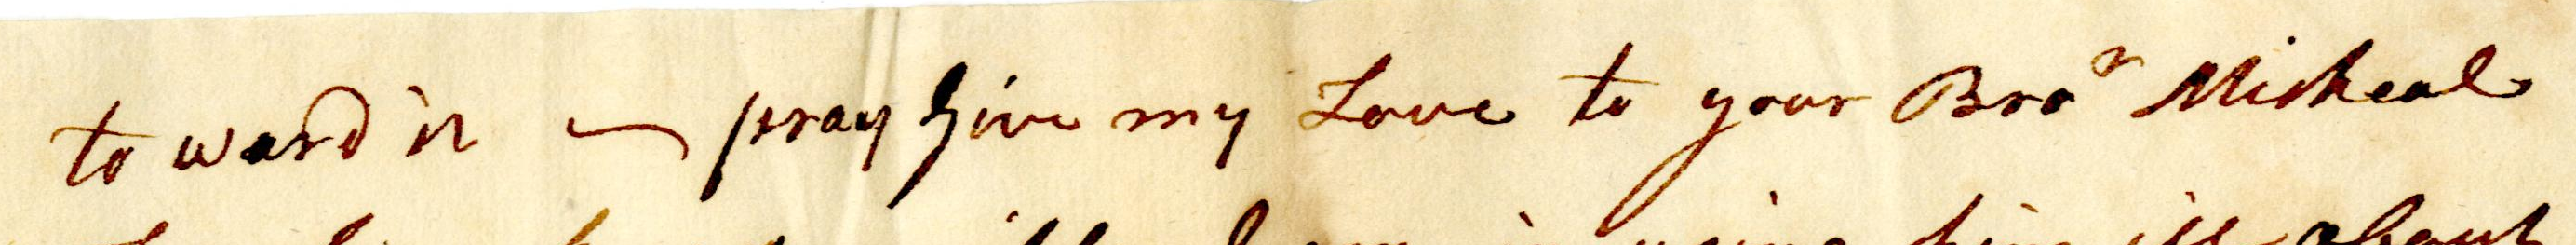to ward in.- pray give my Love to your Bro^r Micheal
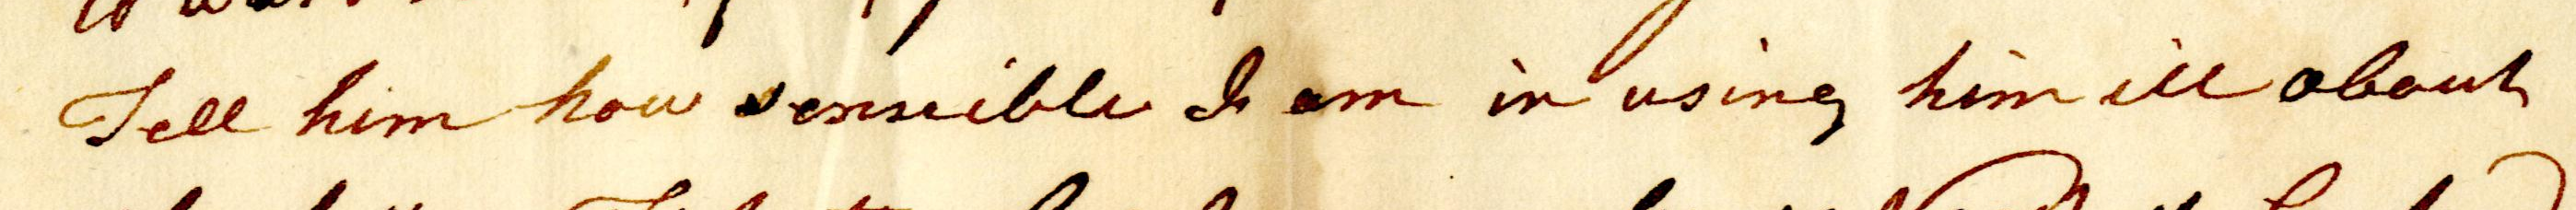Tell him how senseible I am in using him ill about
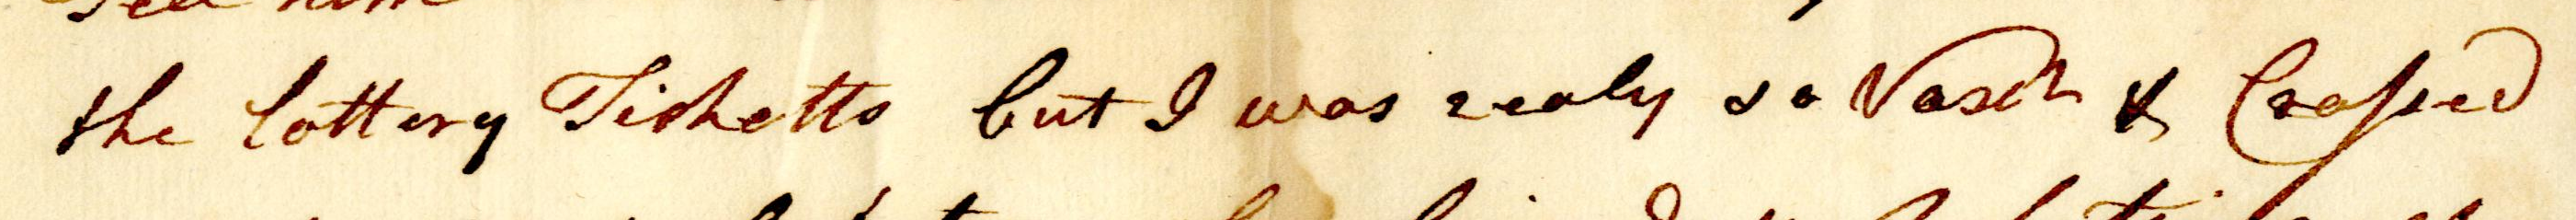the lottery Ticketts but I was realy so Vex^t & Crossed
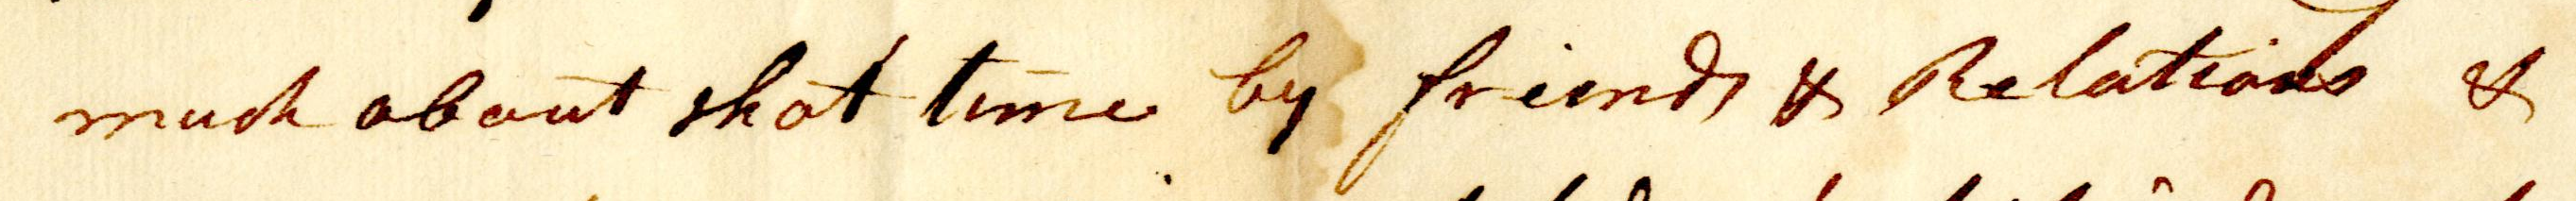much about that time by friends & Relations &
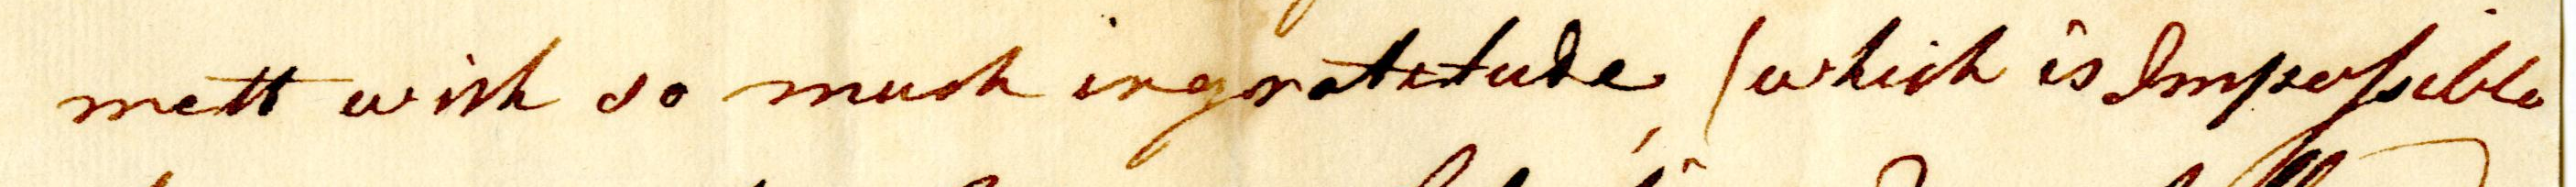mett with so much ingratitude, (which is Impossible,
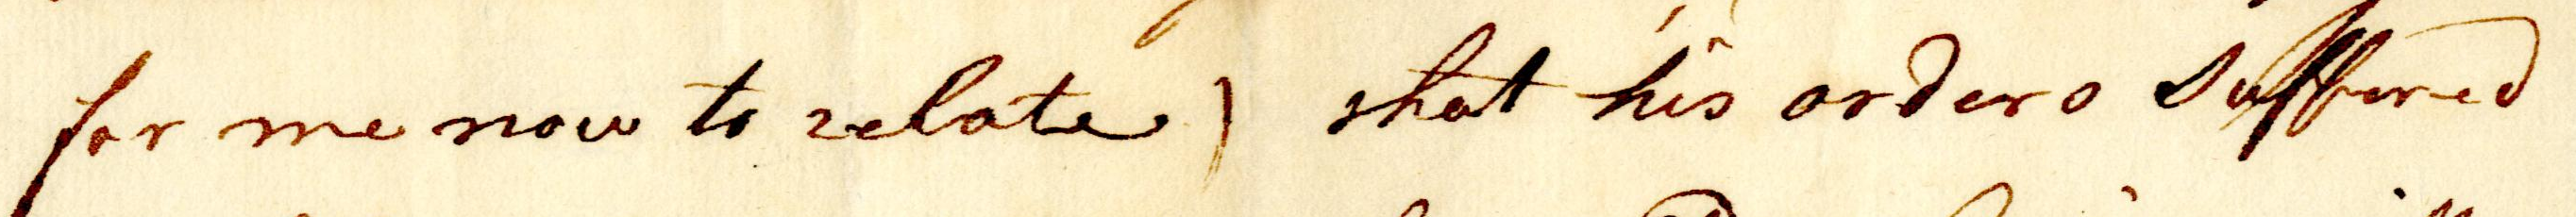for me now to relate) that his orders suffered
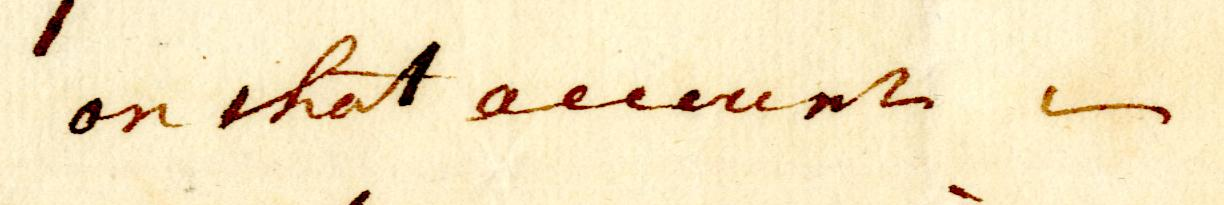on that account-
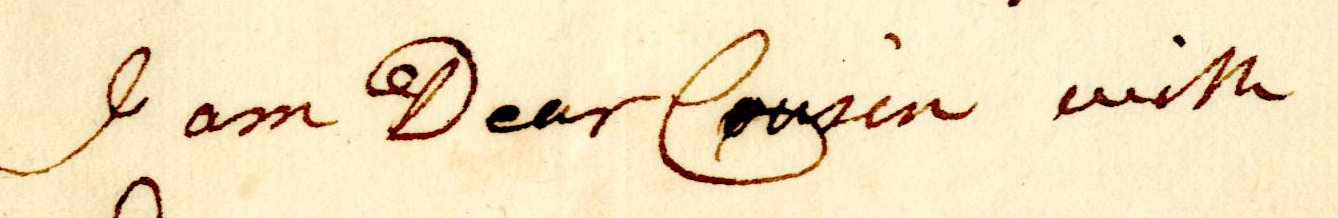I am Dear Cousin with
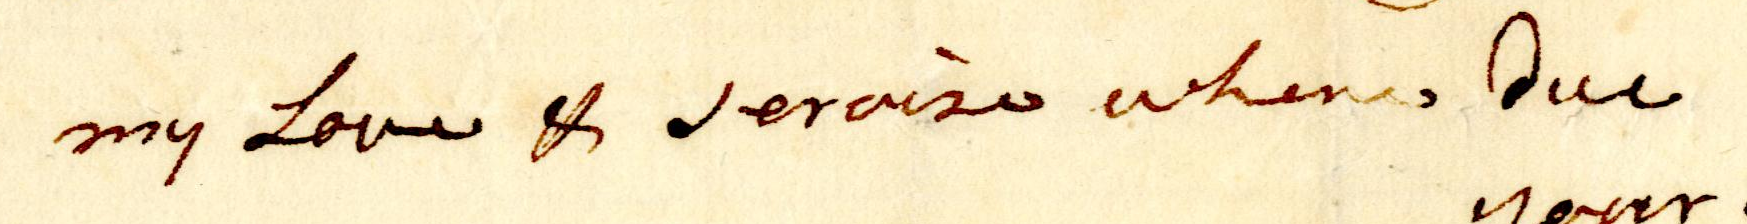my Love & service when due
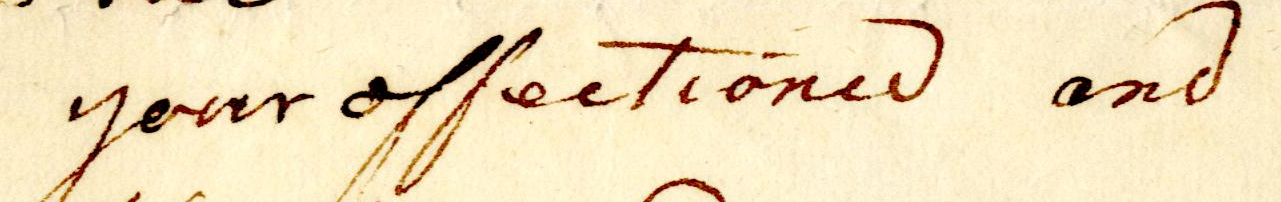your affectioned and
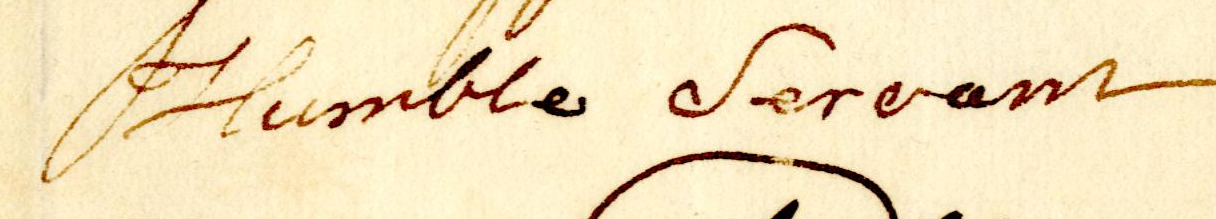Humble Servant
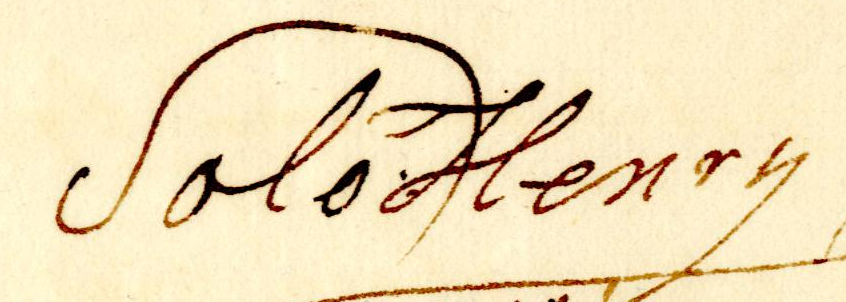Solo. Henry
